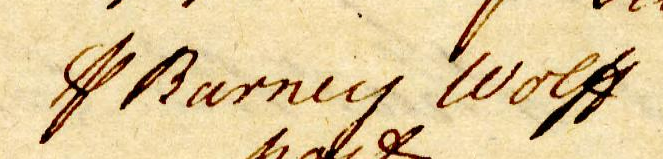per Barney Wolff
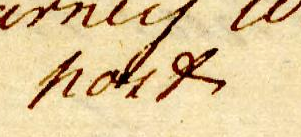post
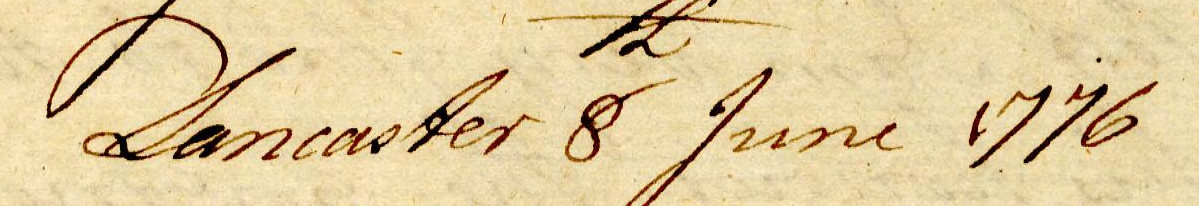Lancaster 8^th June 1776
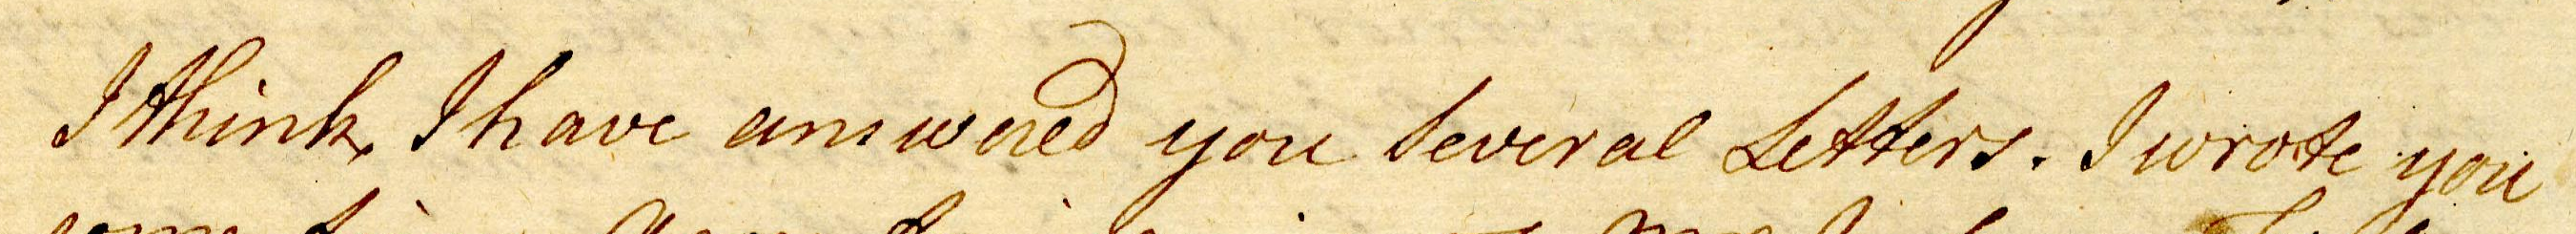I think, I have answered you several Letters. I wrote you
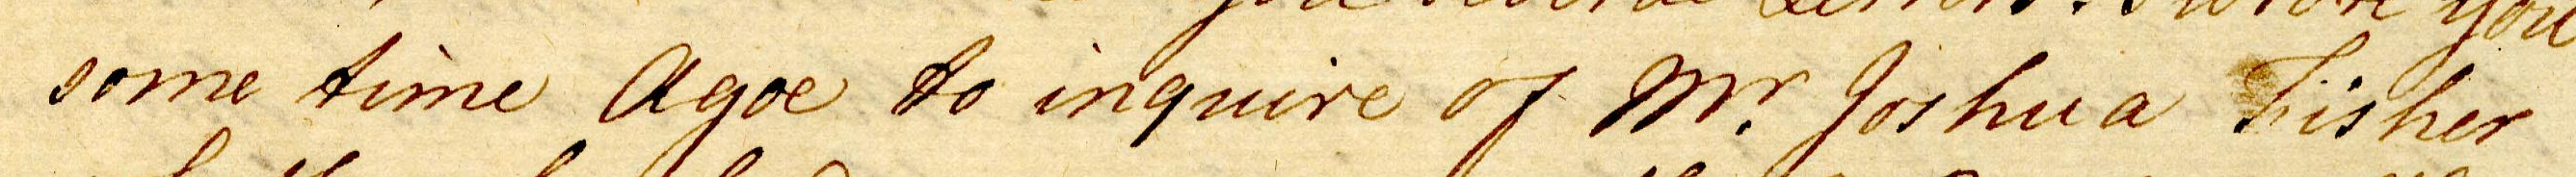some time Agoe to inquire of M^r. Joshua Fisher
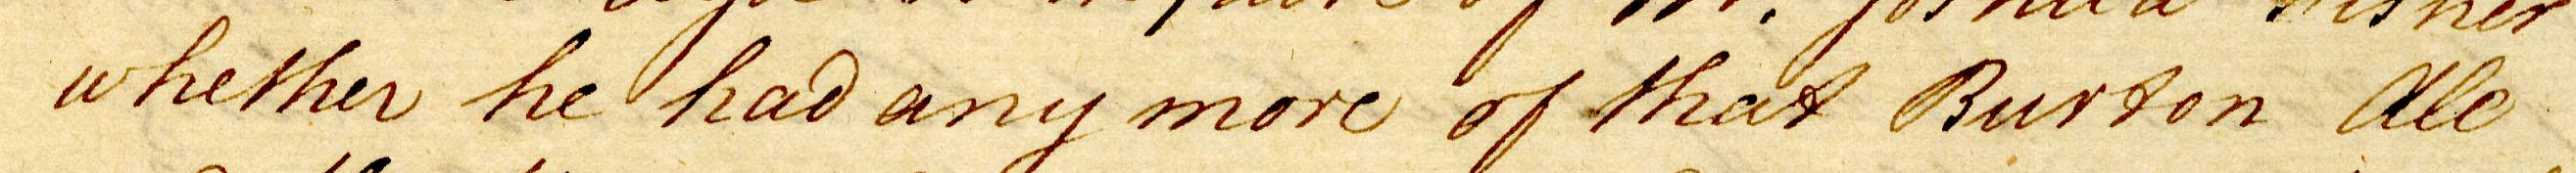whether he had any more of that Burton Ale
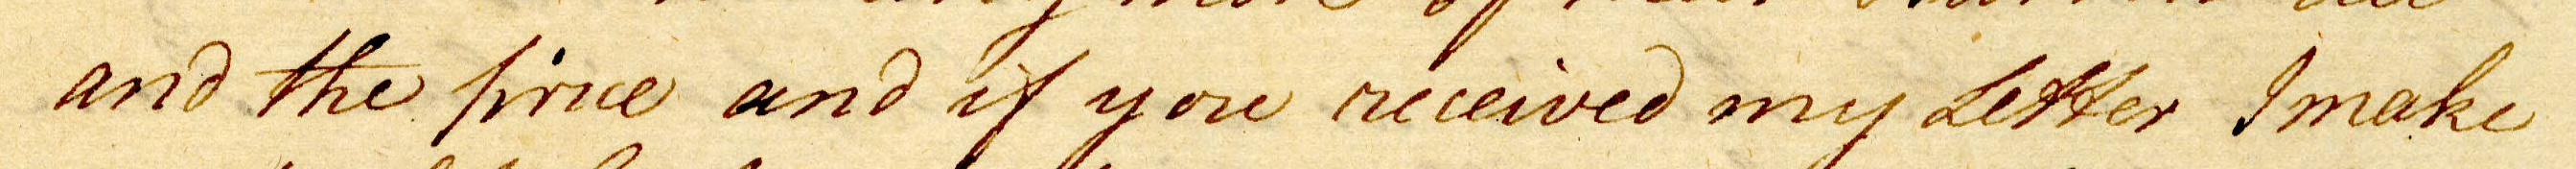and the price and if you received my Letter I make
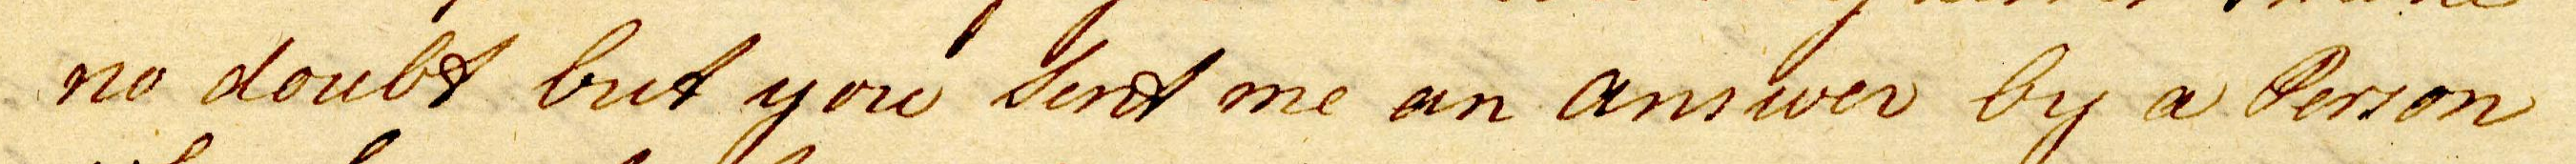no doubt but you sent me an Answer by a Person
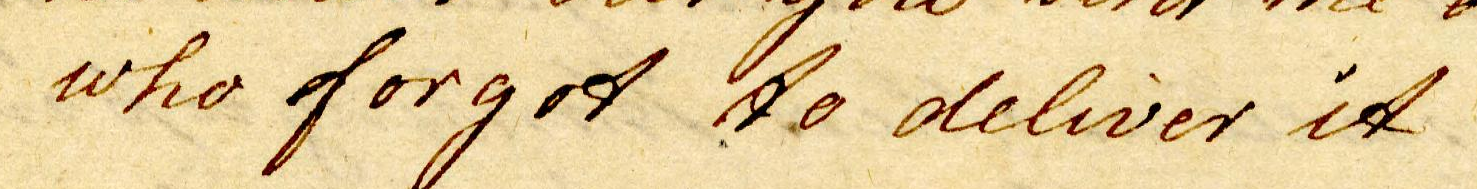who forgot to deliver it
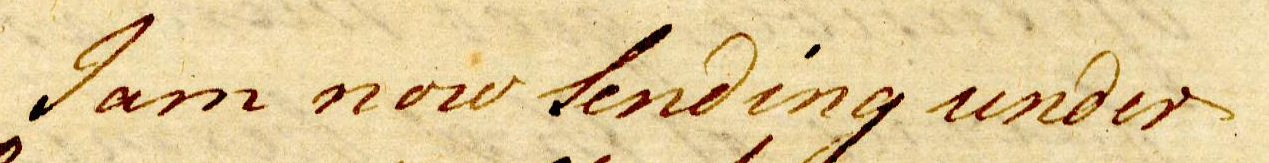I am now sending under
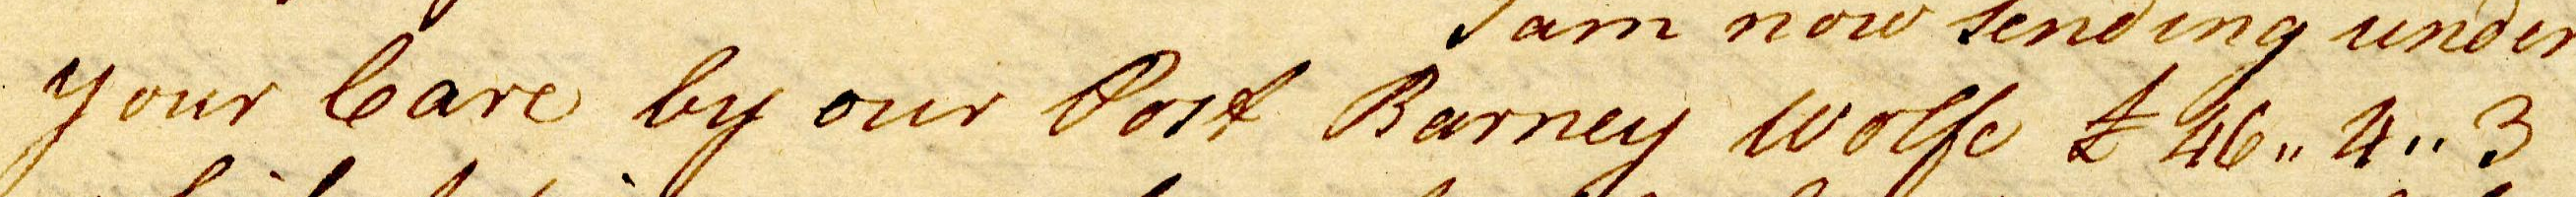your Care by our Post Barney Wolfe £46..4..3
